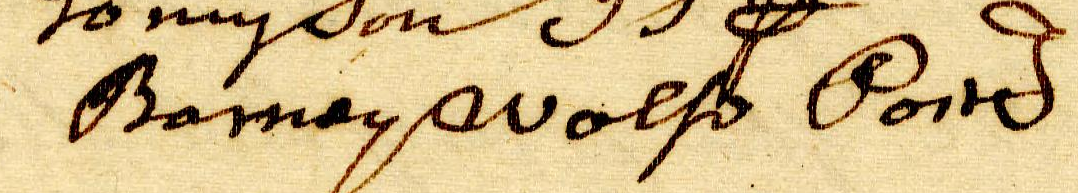Barney Wolfs Post
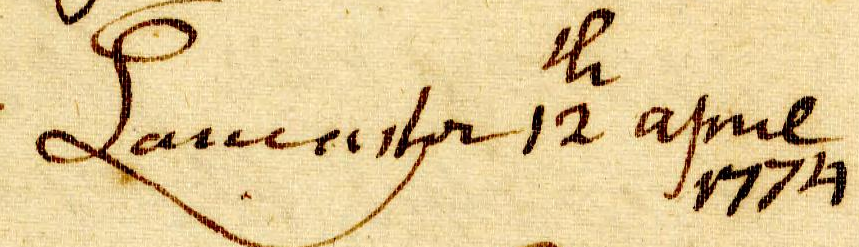Lancaster 12^th april
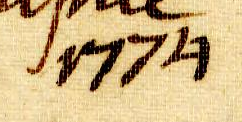1774
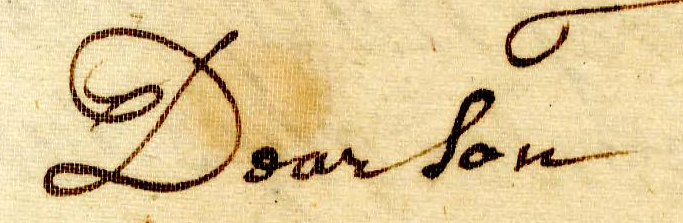Dear Son
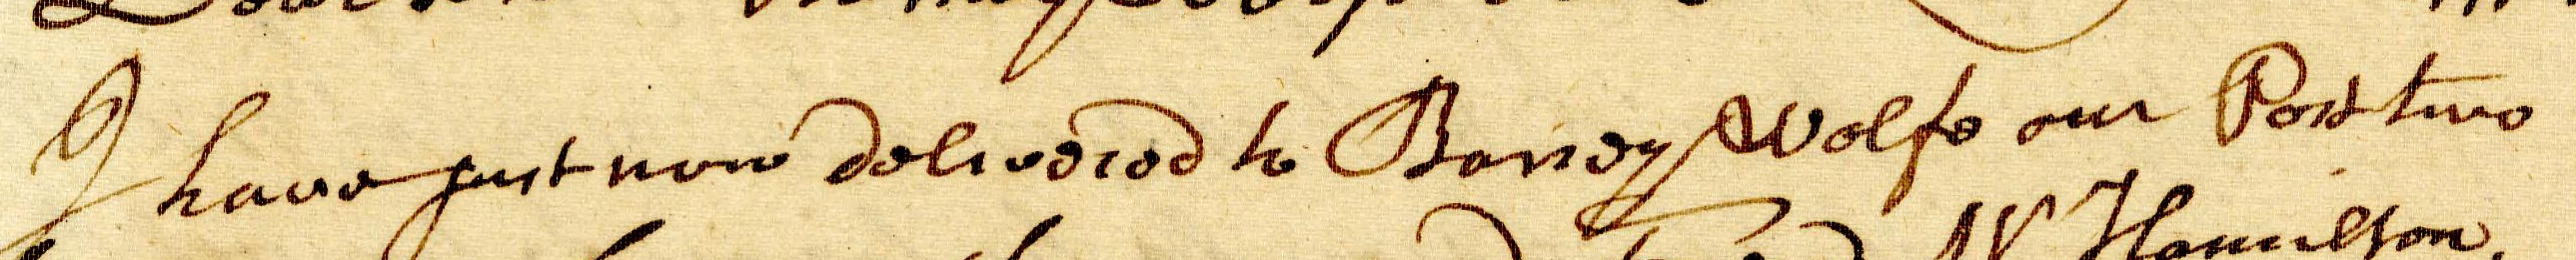I have just now delivered to Barney Wolfs our Post two
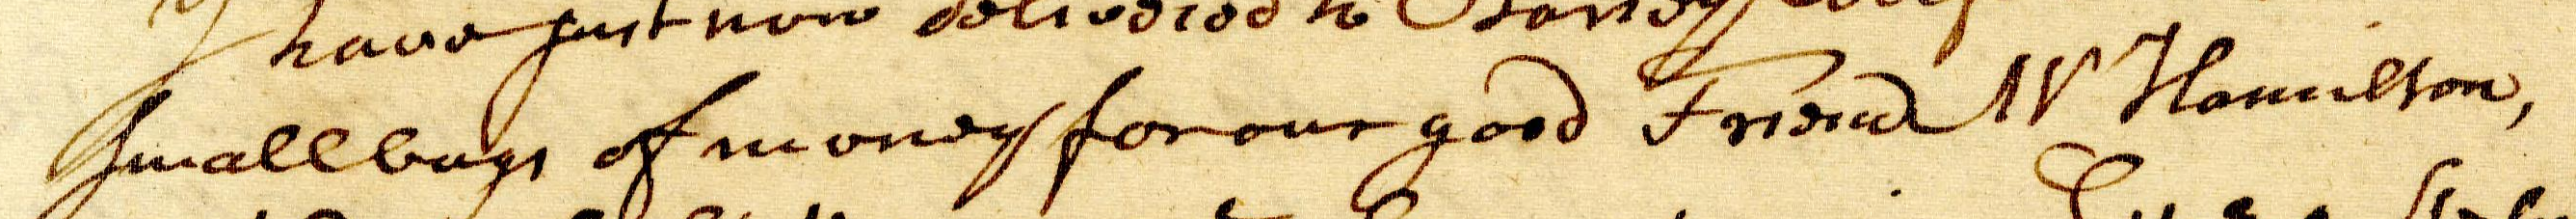small bags of money for our good Friend M^r Hamilton,
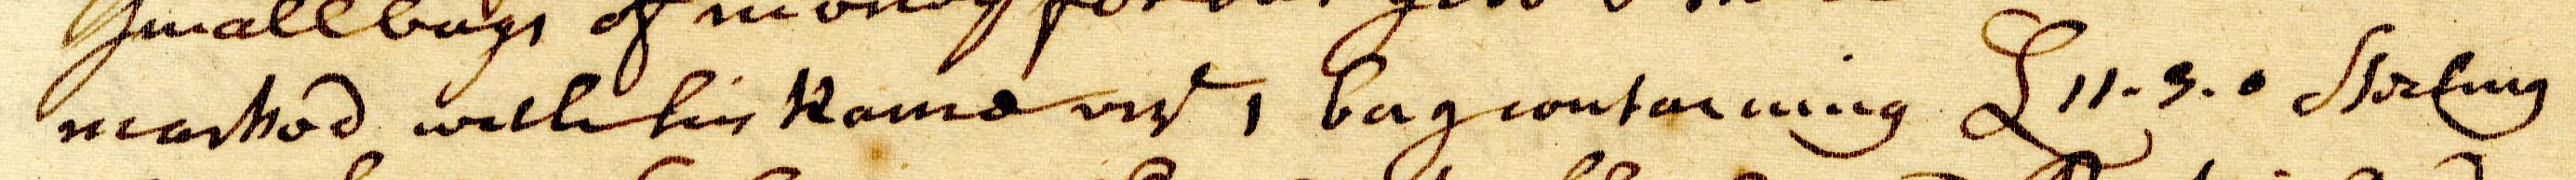marked with his Name viz^t, bag containing £11.3.0 Sterling
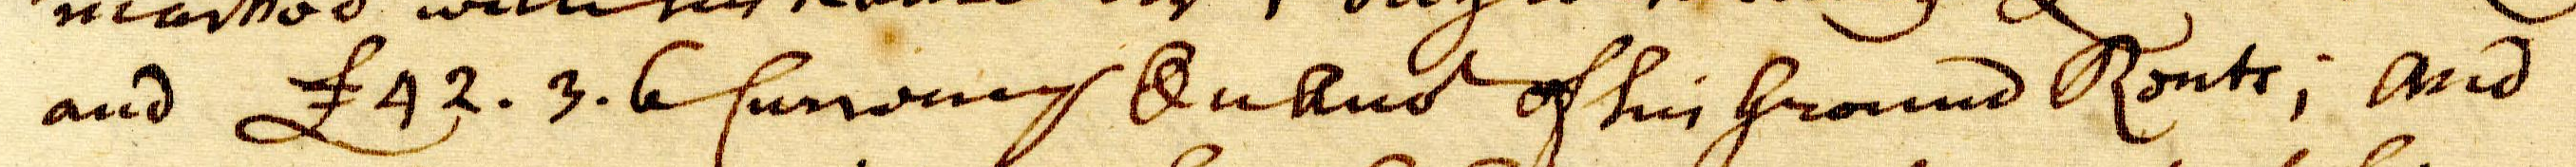and £42.3.6 Currency On Aco^t of his Ground Rents; And
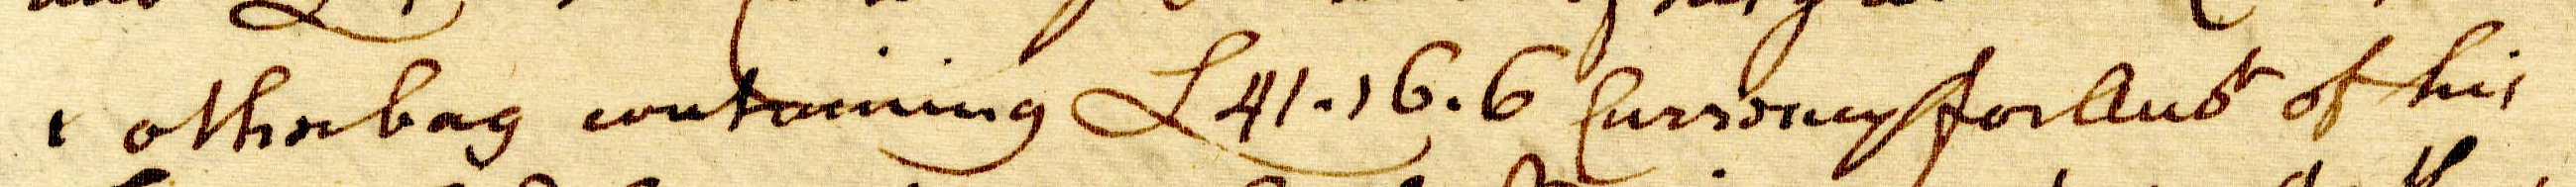other bag containing £41.16.6 Currency for Acco^t of his
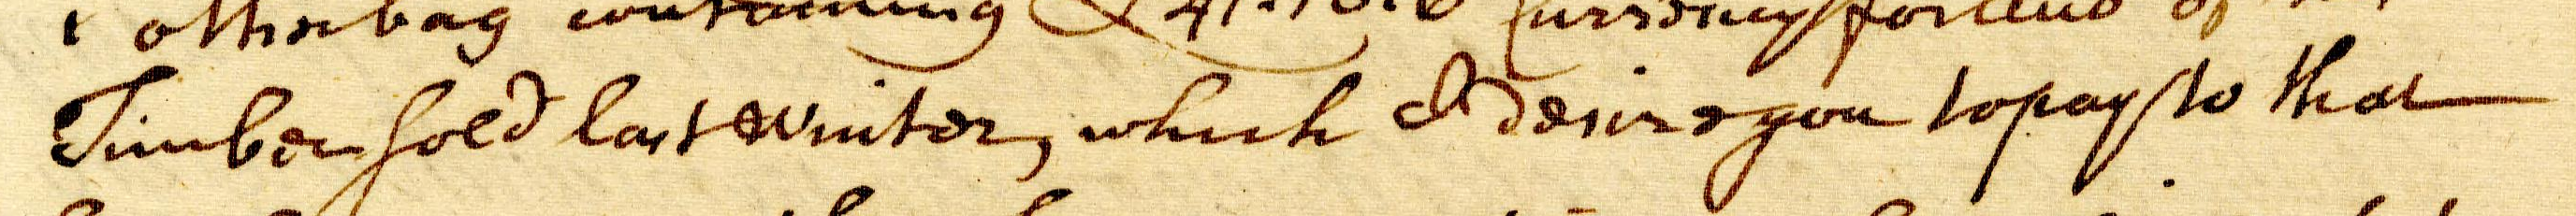Timber sold last Winter, which I desire you to pay to that
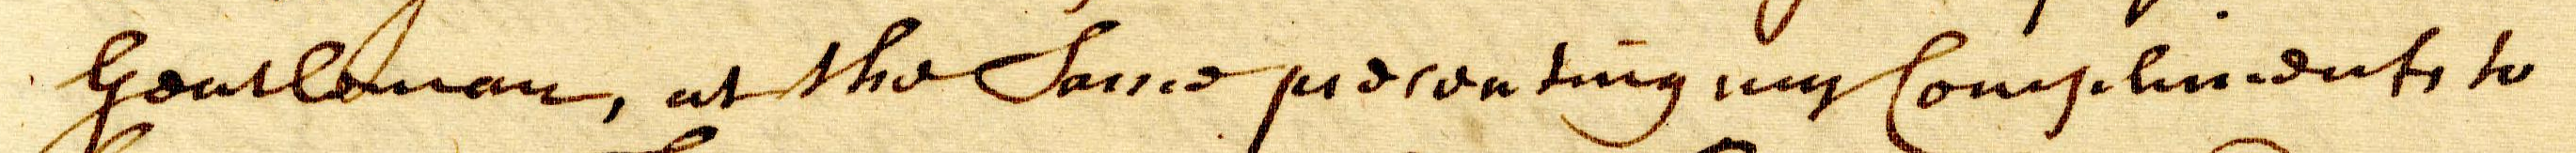Gentleman, at the Same presenting my Compliments to
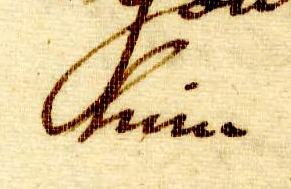him
